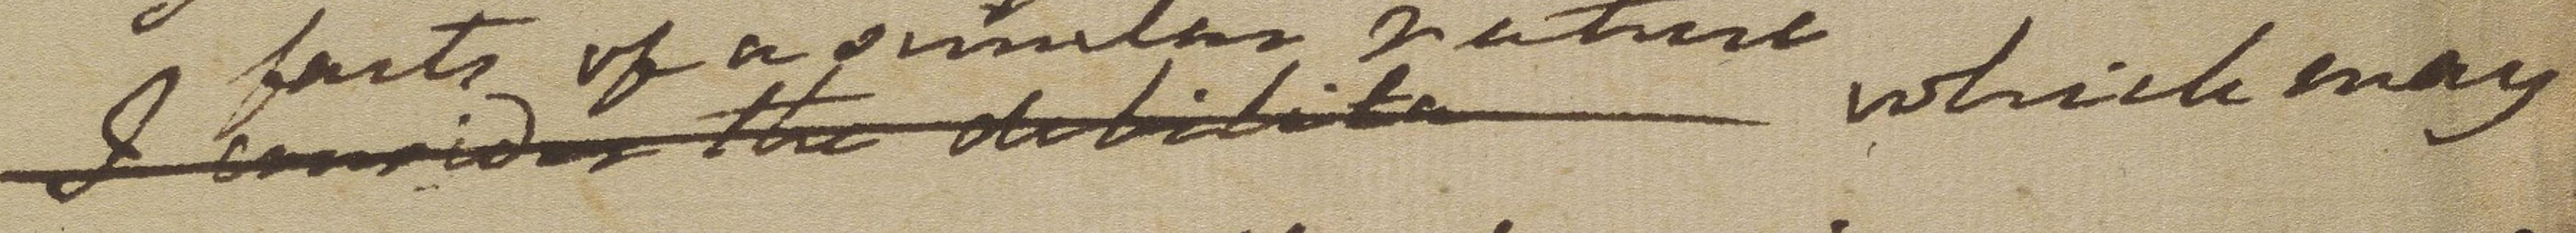[I consider the debilita] which may
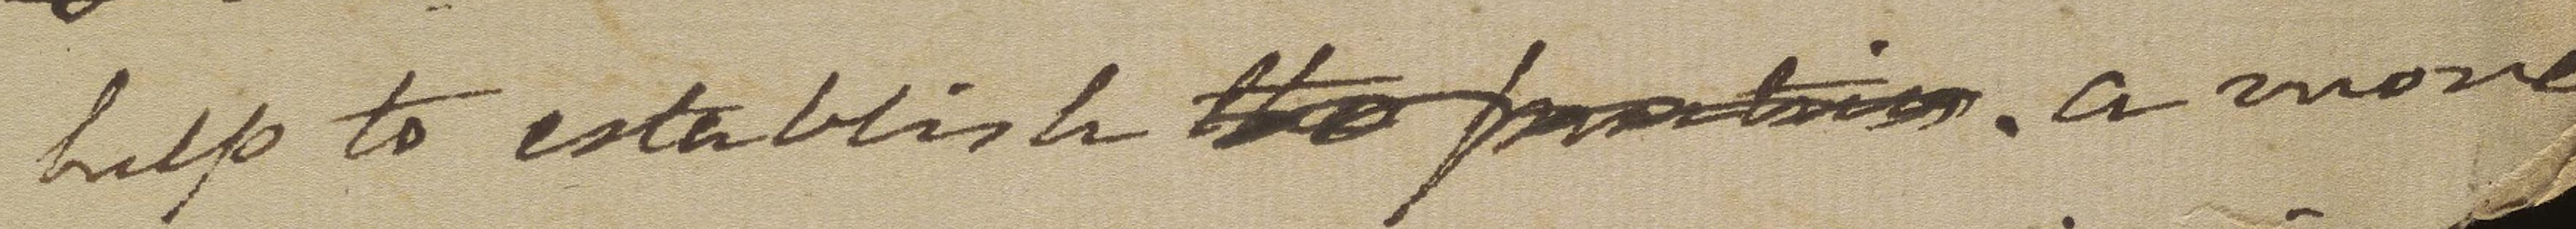help to establish [the practice]. A more
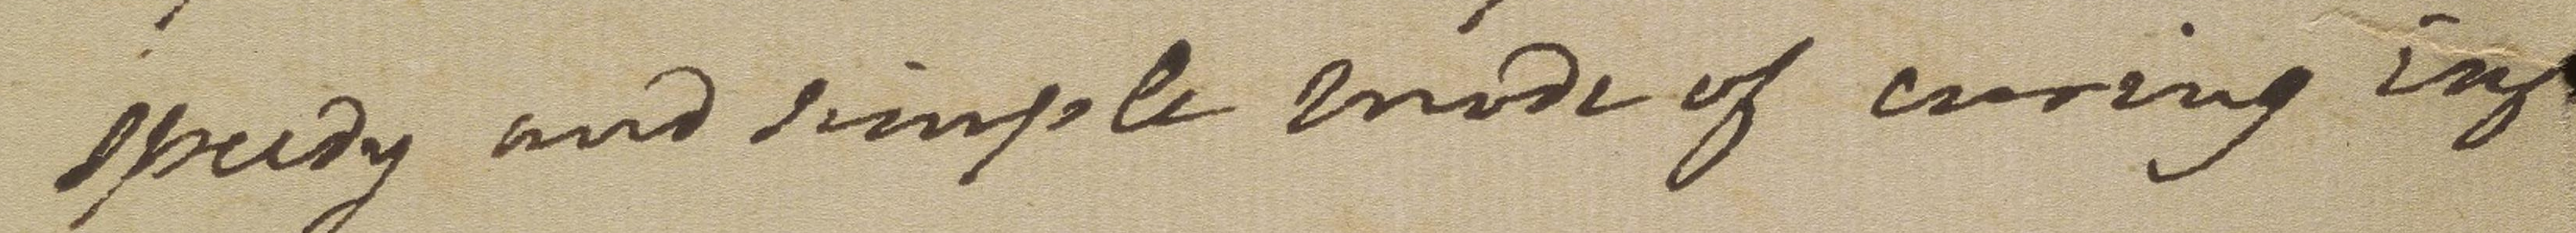speedy and simple mode of curing inf-
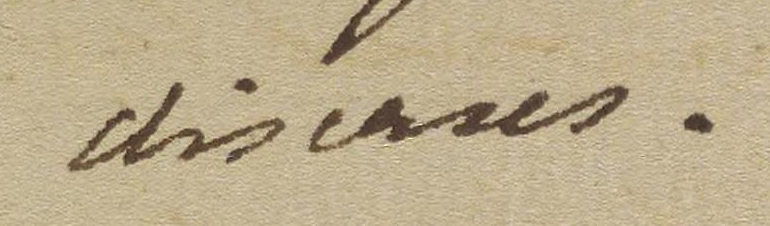diseases.
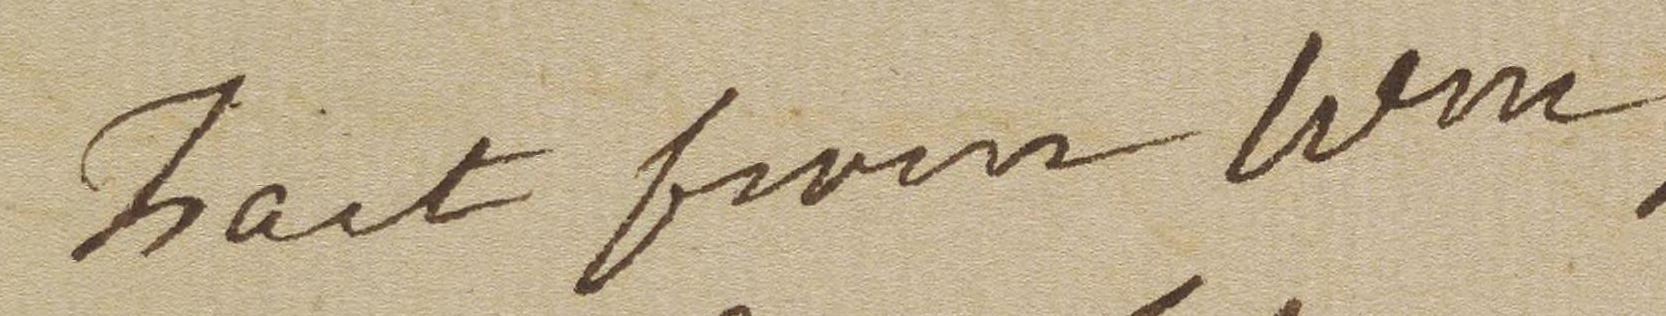Fact from W^m
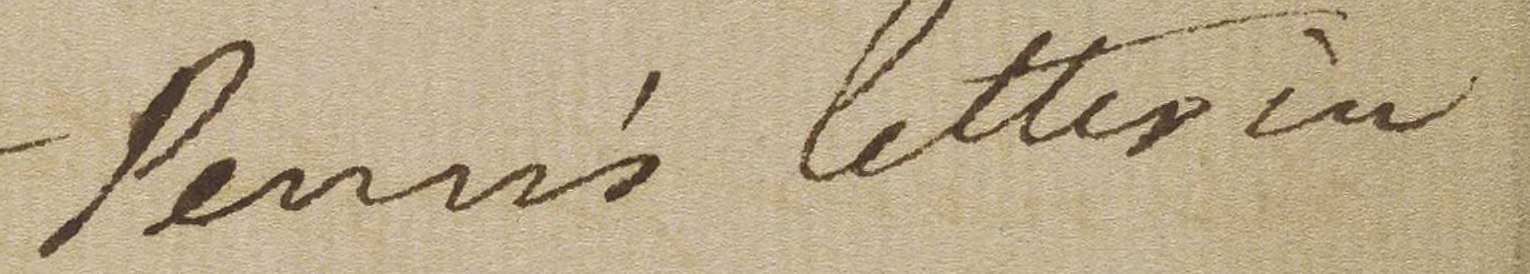Penn's letter in
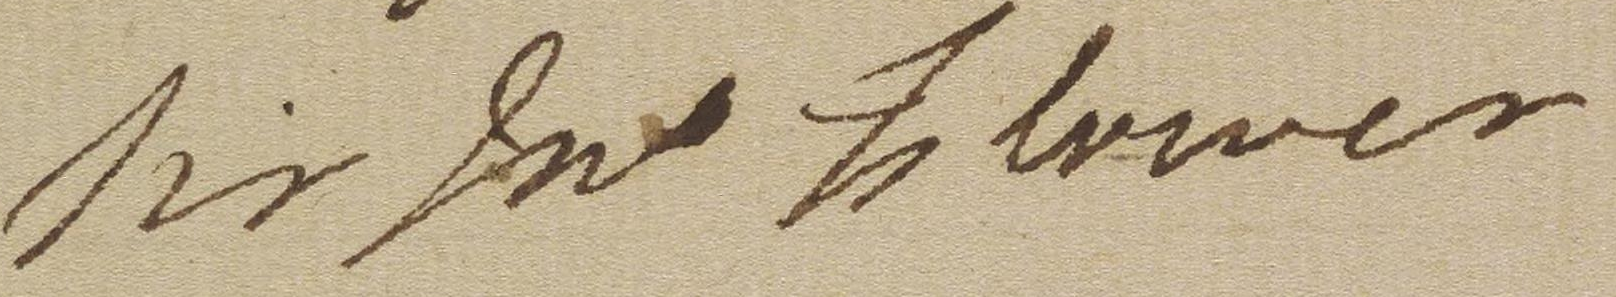Air In Fluver
